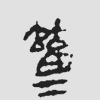{竹𨾴}
